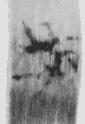{廿四}
